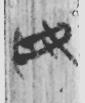母
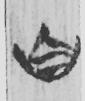自
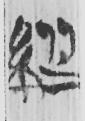{糸從}（縱）
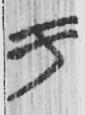于
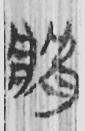{爿兔}
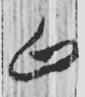㠯（以）
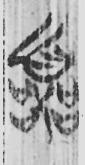囂
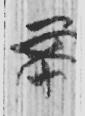不
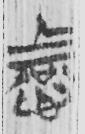𢝬
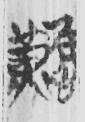戁（難）
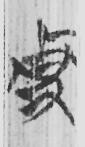{小日儿}
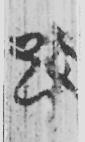改
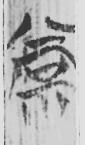常
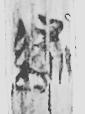絉
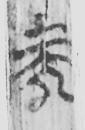而
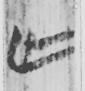亡
